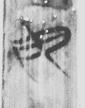母
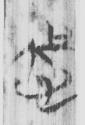{吴心}
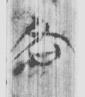各
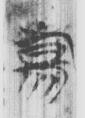{㫃昜}
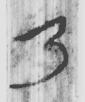乃
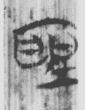聖
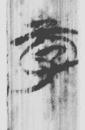{亓子}
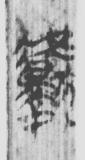獻
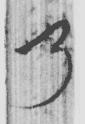乃
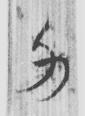力
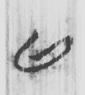㠯（以）
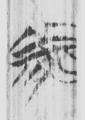羕
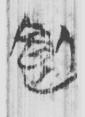飤
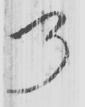乃
